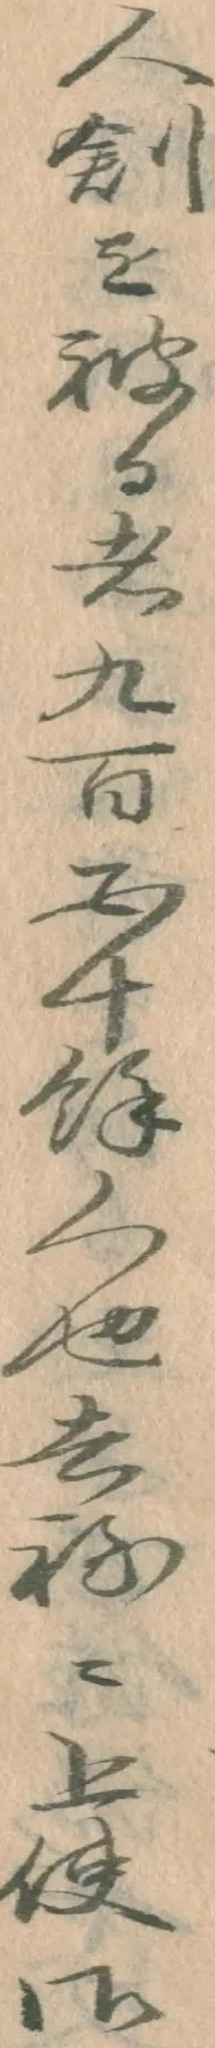人創を破る者九百五十余人也去？に上使御
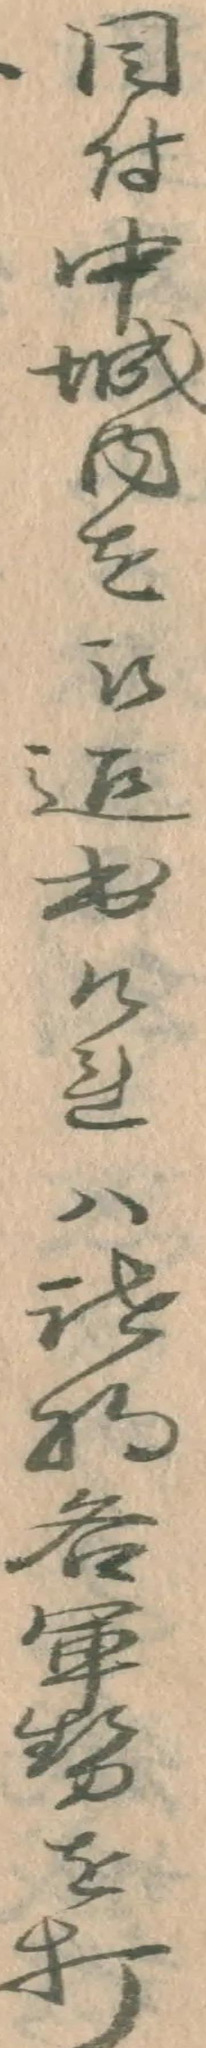目付中城内を被追出け連は諸将各軍勢を打
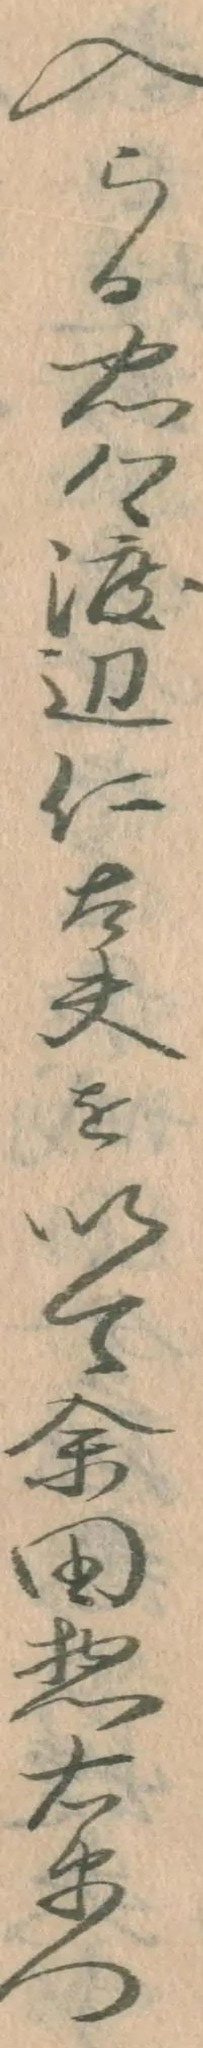入らる忠郷渡辺仁太夫を以て余田惣右衛門
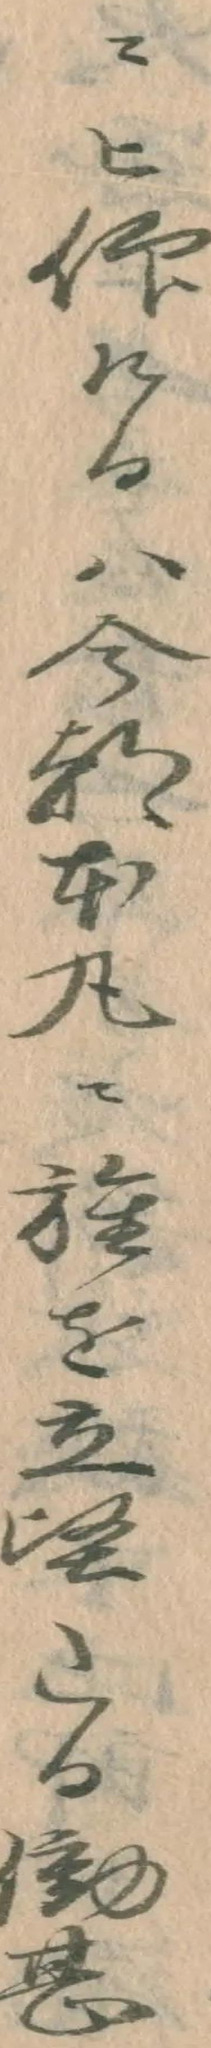に被仰けるは今朝本丸に旗を立堅たる働甚
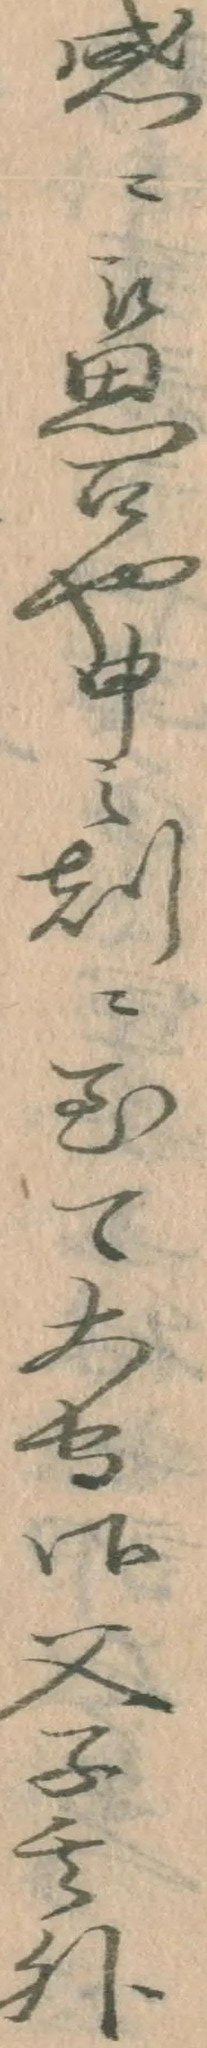感に被思召也申之刻に至て大守御父子其外
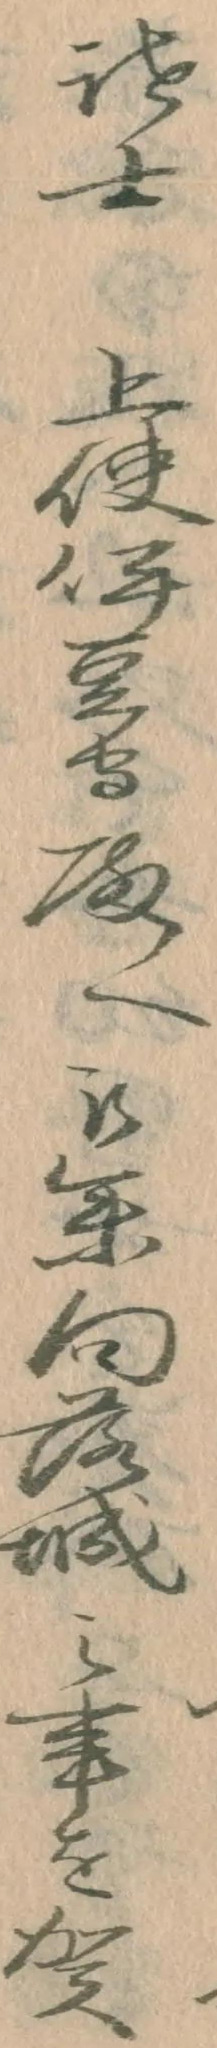諸士上使伊豆守殿へ被参向落城之事を賀
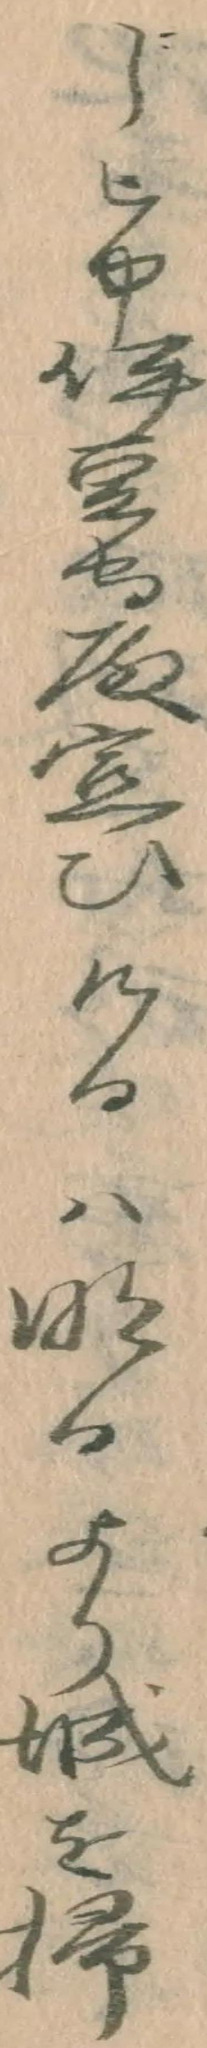し被申伊豆守殿宣ひけるは明日より城を掃
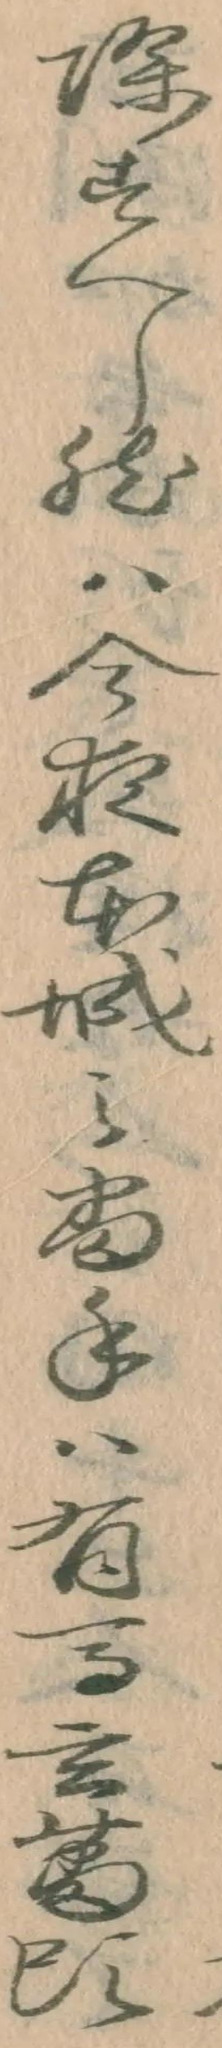除春へし然は今夜本城之番手は有馬玄蕃頭
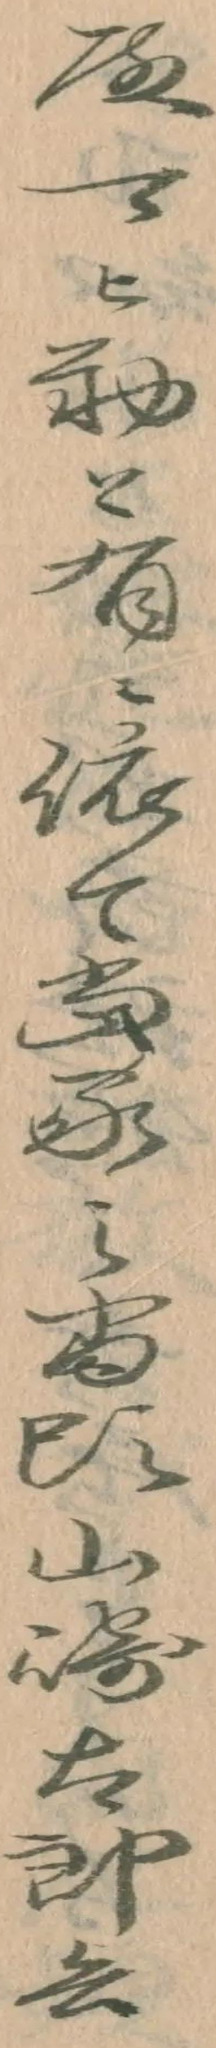殿可被勤と有に依て当家之番頭山崎太郎兵
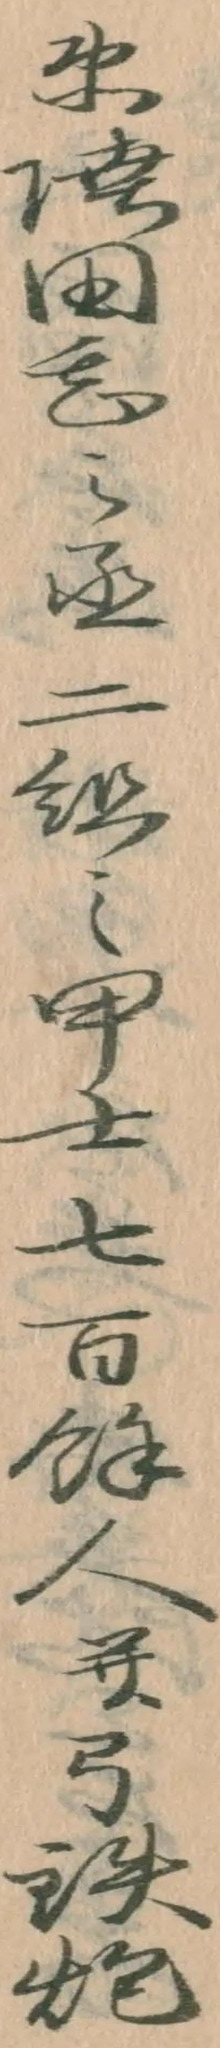衛陸田甚之丞二組之甲士七百余人幷弓鉄炮
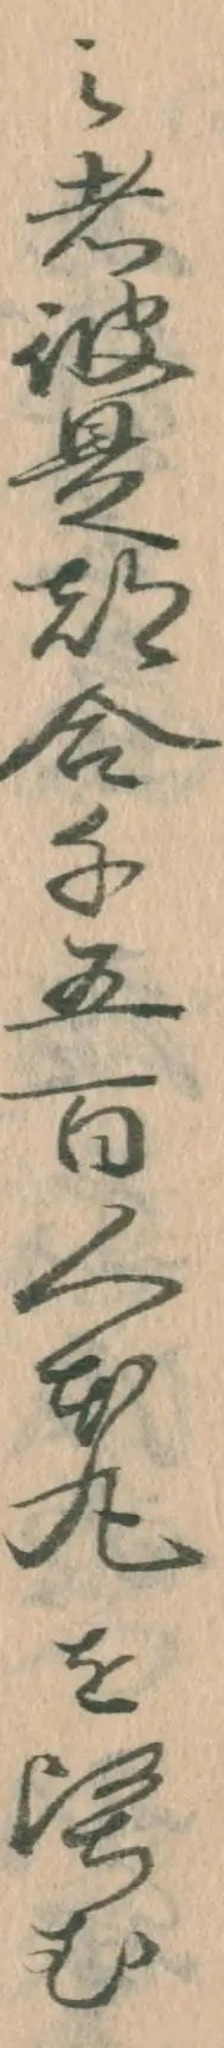之者彼是都合千五百人本丸を堅む
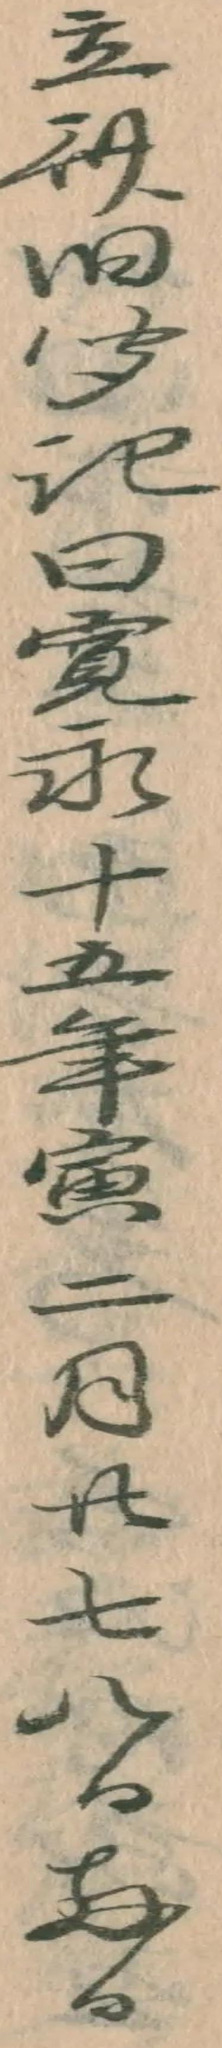立斎旧聞記曰寛永十五年寅二月廿七八日両日
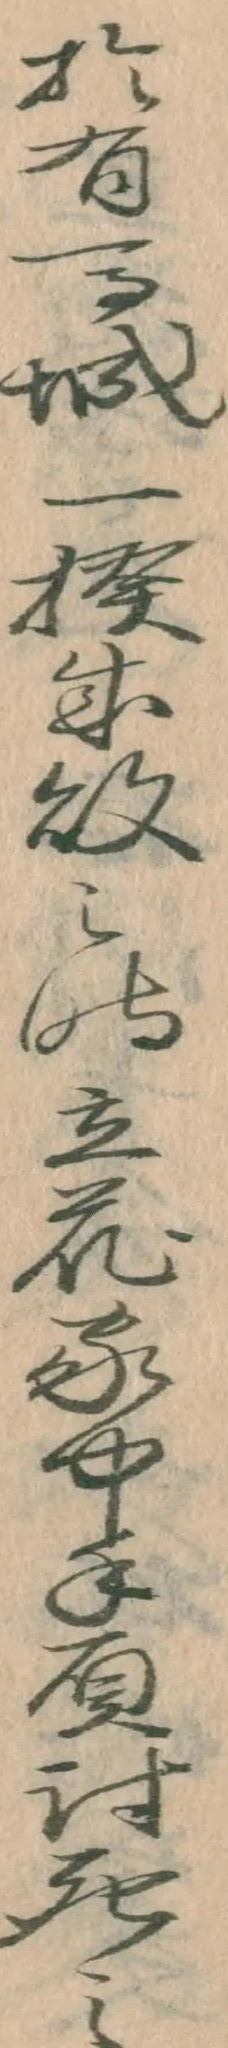於有馬城一揆成敗之時立花家中手負討死之
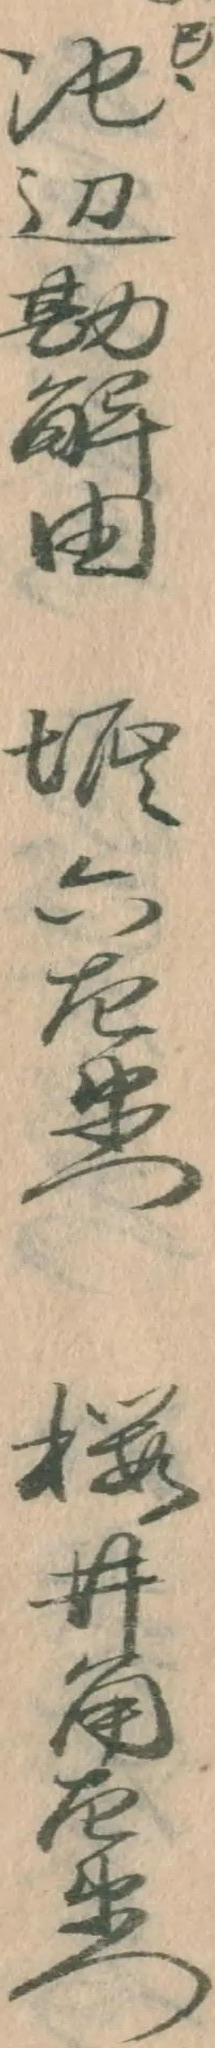池辺勘解由堀六左衛門桜井角左衛門
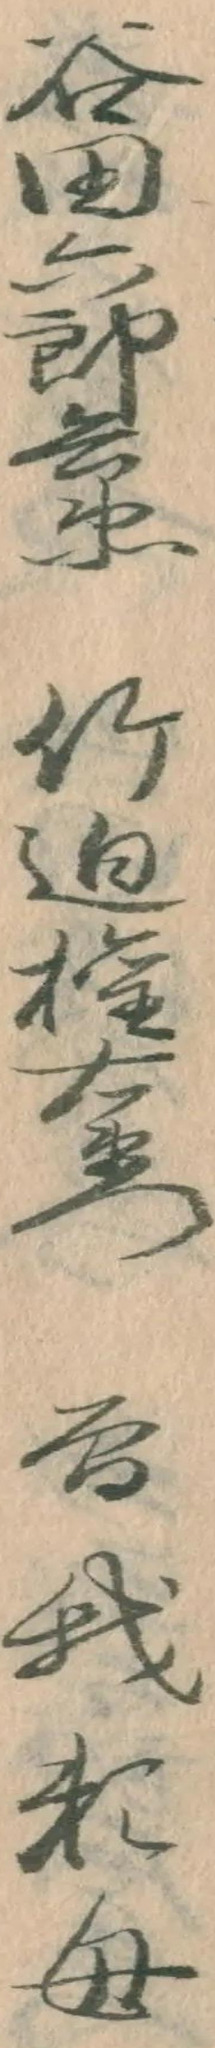谷田六郎兵衛竹迫権右衛門曽我頼母
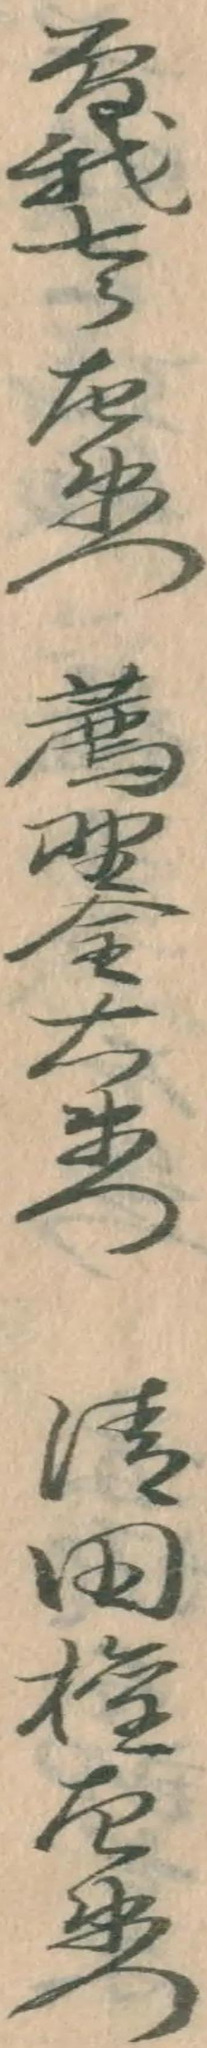曽我七郎左衛門薦野金右衛門清田権左衛門
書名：切支丹御退治記 49巻. [9]
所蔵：国立国会図書館 National Diet Library, JAPAN
